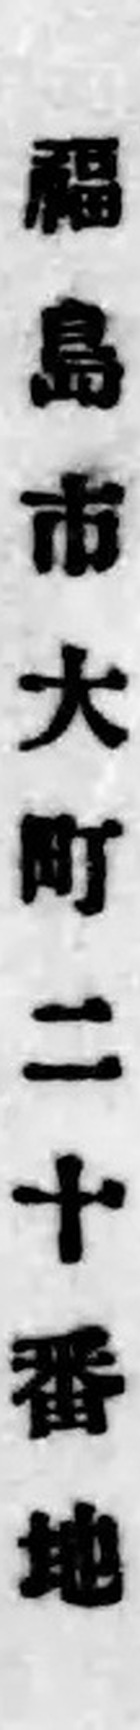福島市大町二十番地
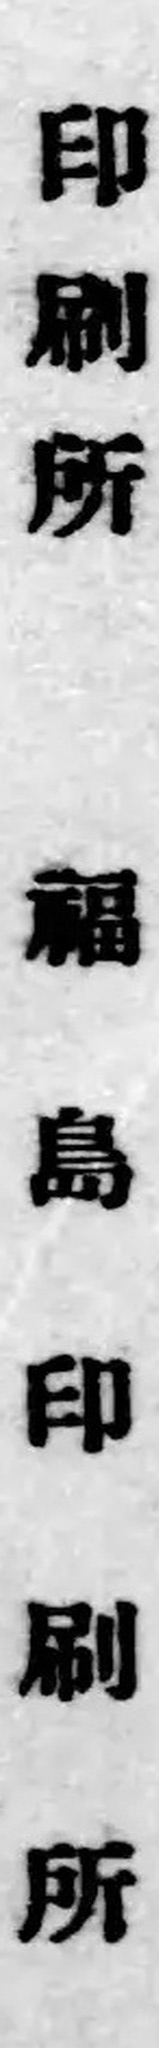印刷所福島印刷所
